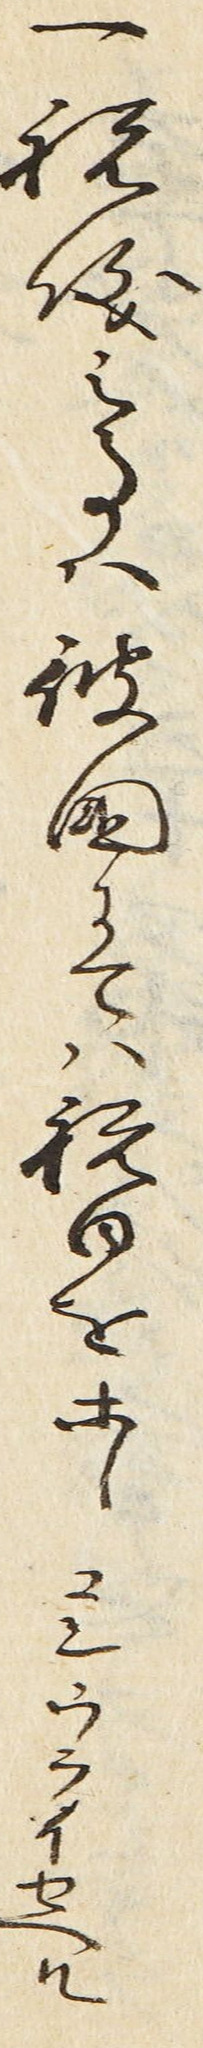一祝儀之事は彼国にては祝日をホーコンウライセヘル
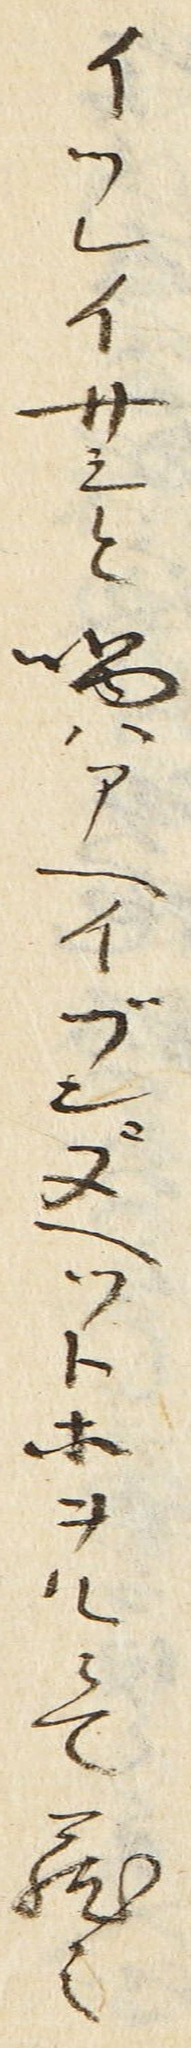イツレイサシと唱ハアヘイブンにヌヘツトホヲルにて蔵之

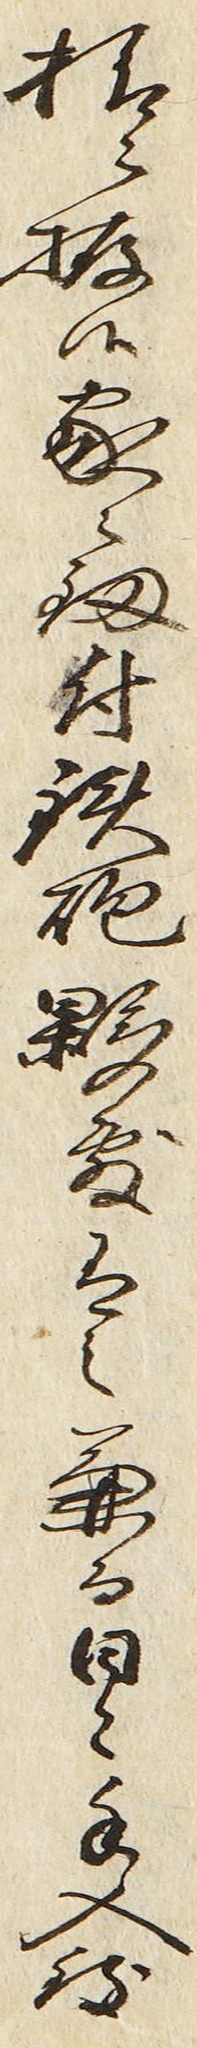様に拵候家に釼付鉄砲夥敷有之兼て日々手入致
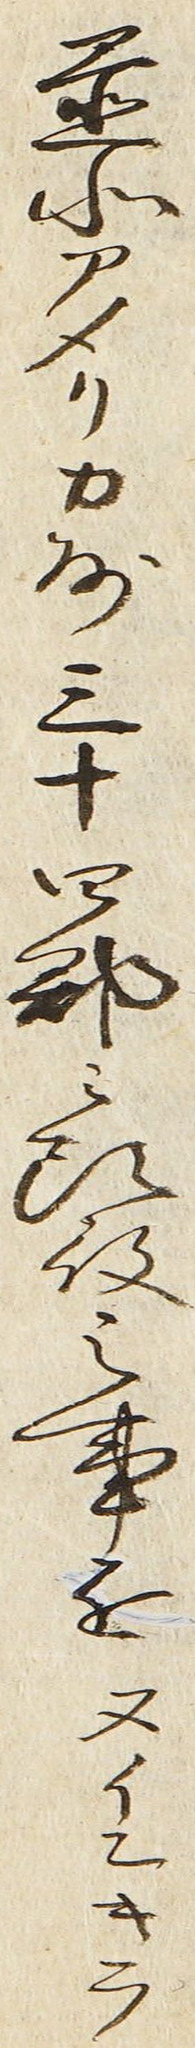置北アメリカ州三十四郡之頭役之事をヌインキラ
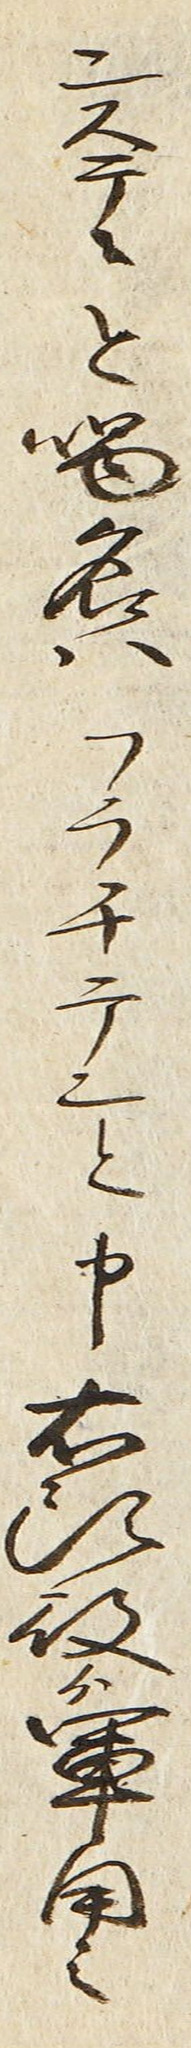ンステーと唱名はフラチテンと申右頭役ゟ軍用之
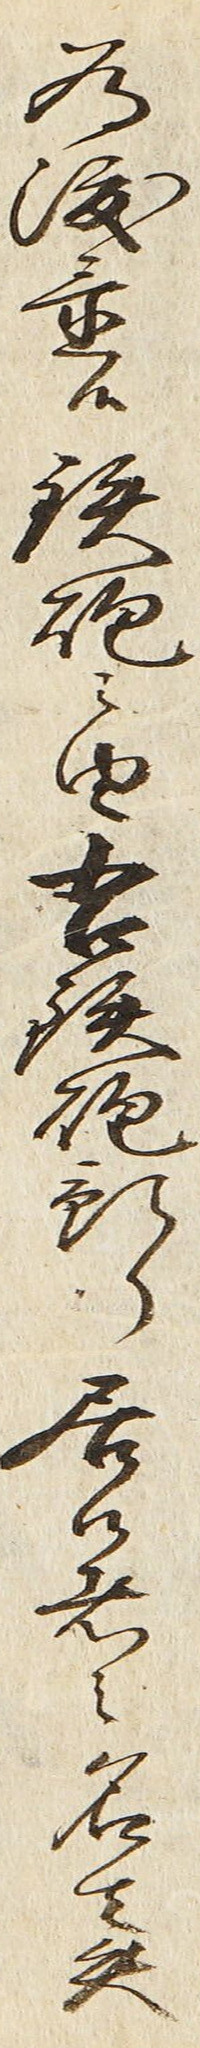為渡置候鉄砲之由右鉄砲預り居候者之名は失
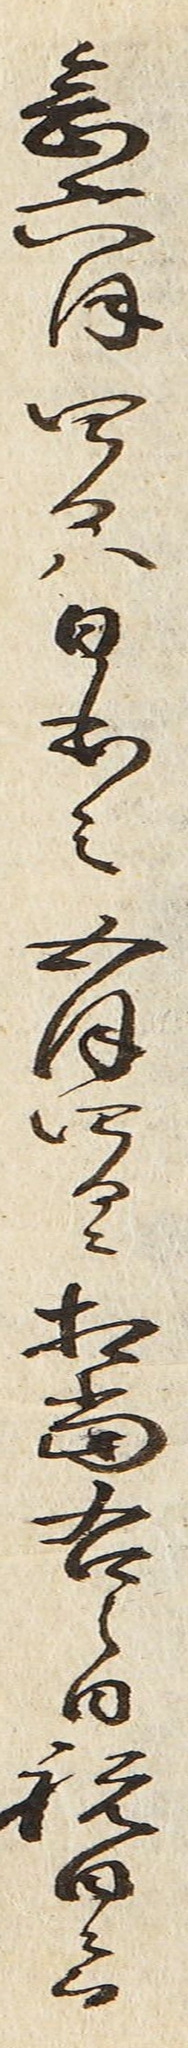念六月四日は日本之五月四日に相当右之日祝日に而
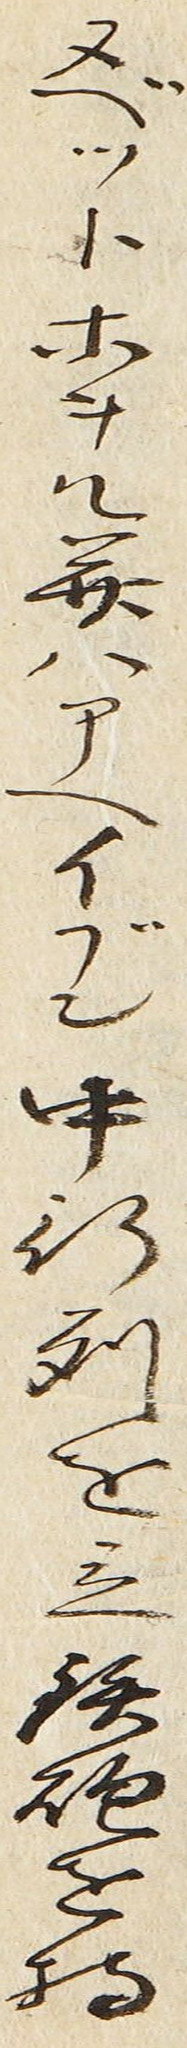ヌベツトホヲル并ハアヘイブン中行列を立鉄砲を持
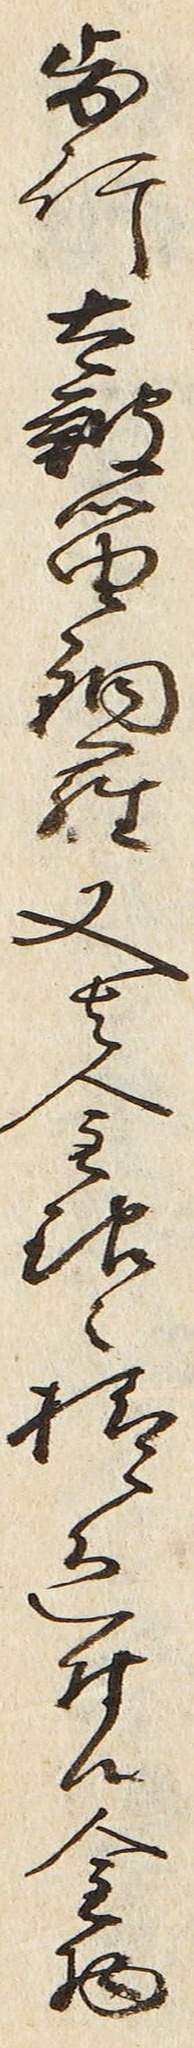歩行太鼓笛銅鑼又は金銀之様に色付候金物
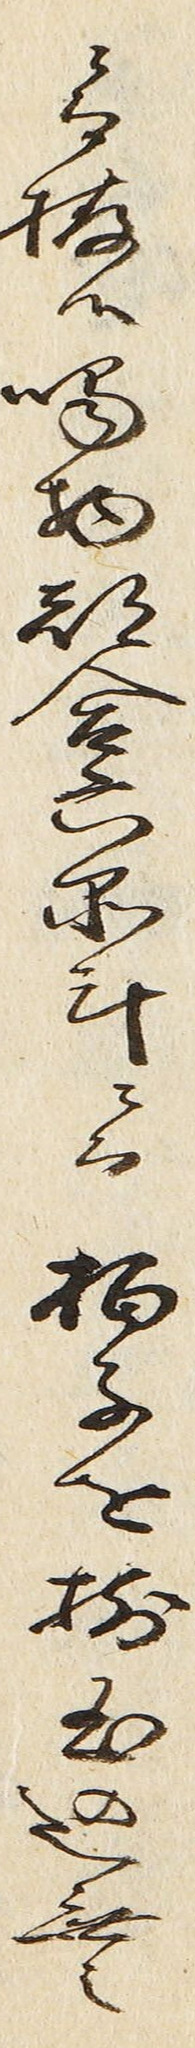に而拵鳴物都合六品計に而拍子を揃弾込無之
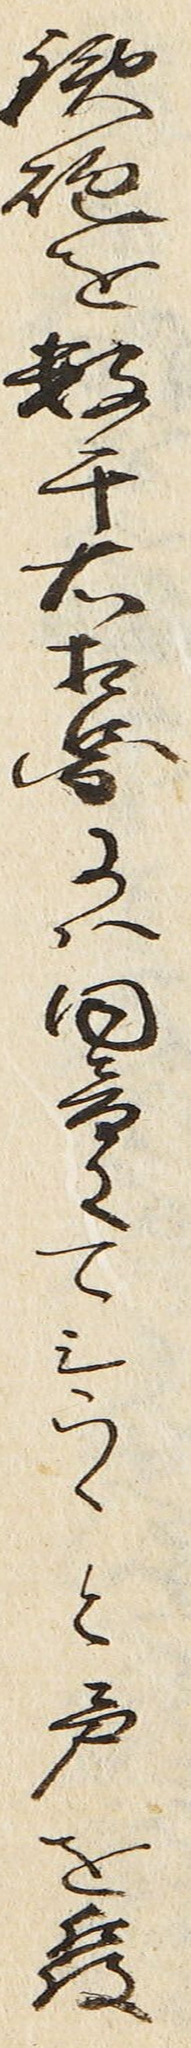鉄砲を数千右相図には同音にてシウ〳〵と声を発
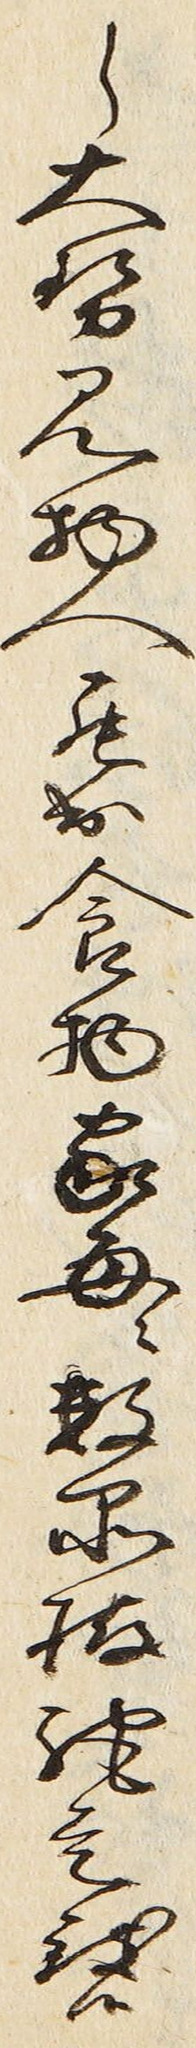し大勢見物人罷出食物家毎に数品拵馳走致候
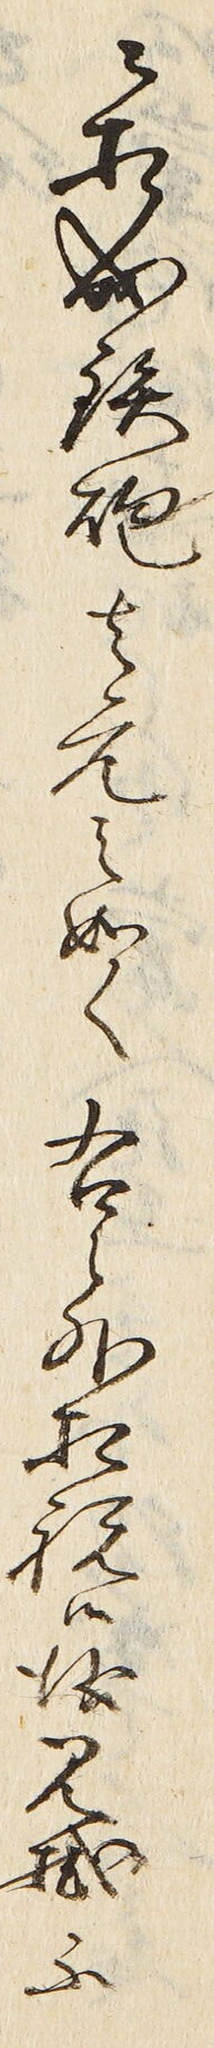に相成鉄砲は元之如く右之外相祝候儀見掛不
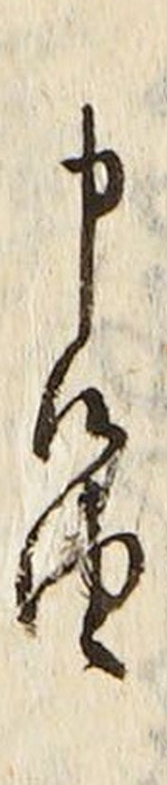申候由
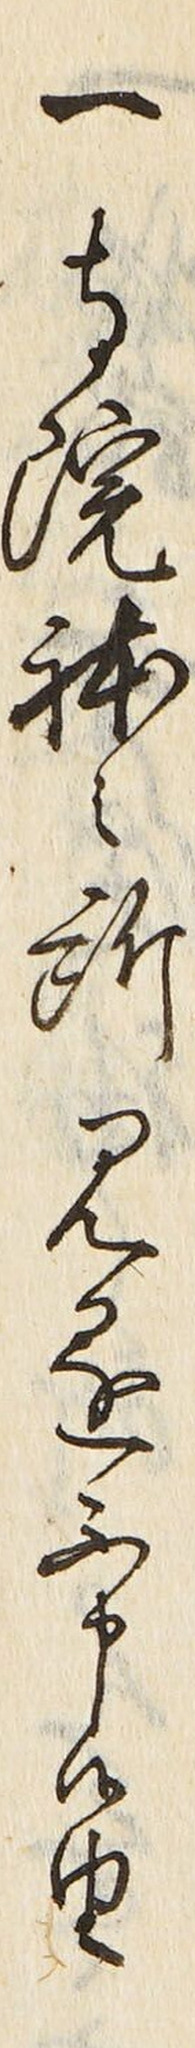一寺院躰之所見懸不申候由
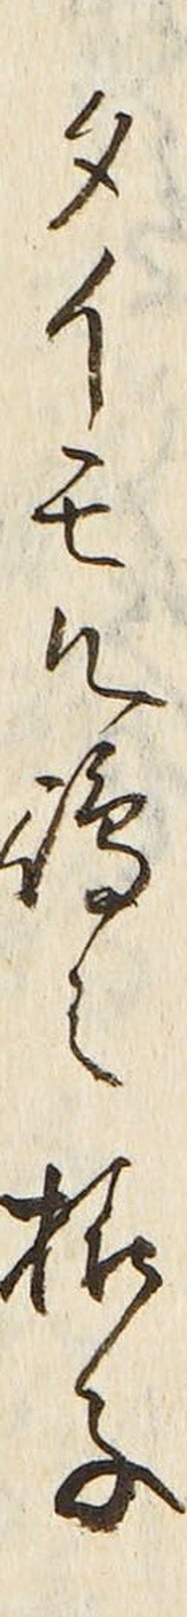タイモル嶋之様子
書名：土佐中浜万次郎漂流記
